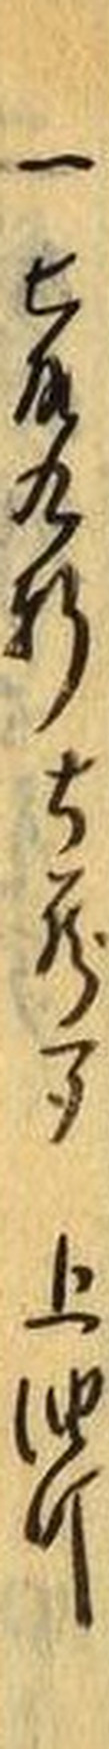一七拾九軒土蔵一ッ上油町
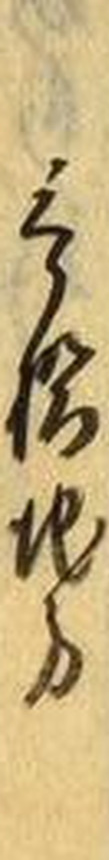三橋地方

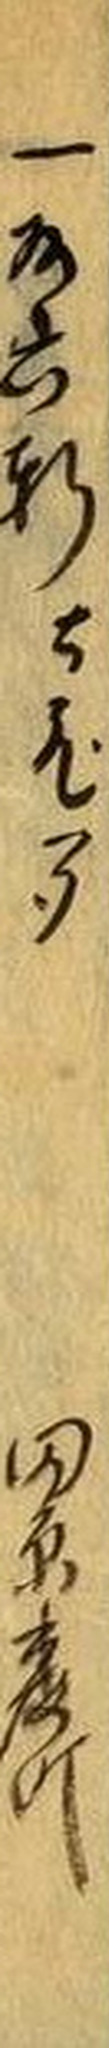一拾六軒土蔵一ッ田原表町
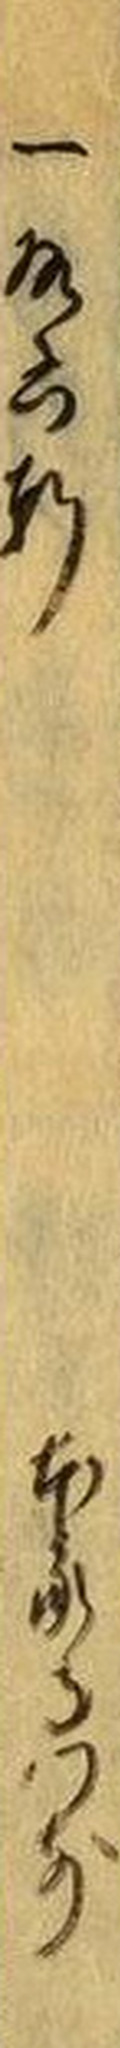一拾六軒本承寺門前
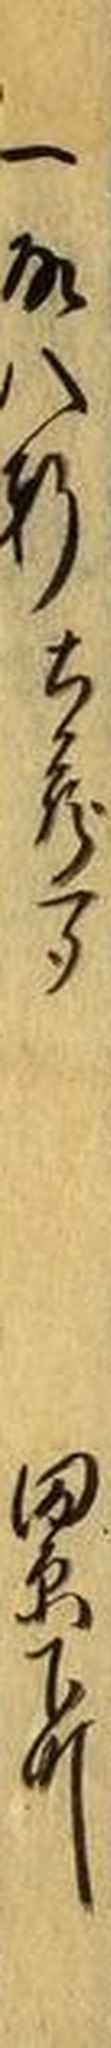一拾八軒土蔵一ッ田原下町
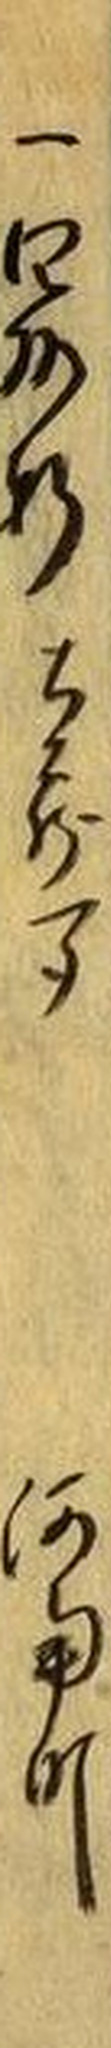一四拾軒土蔵一ッ河南町
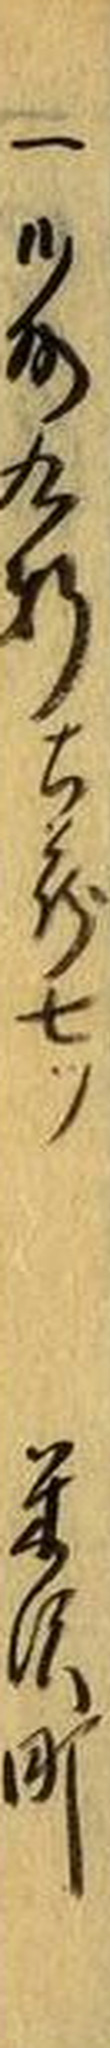一弐拾九軒土蔵七ッ米沢町
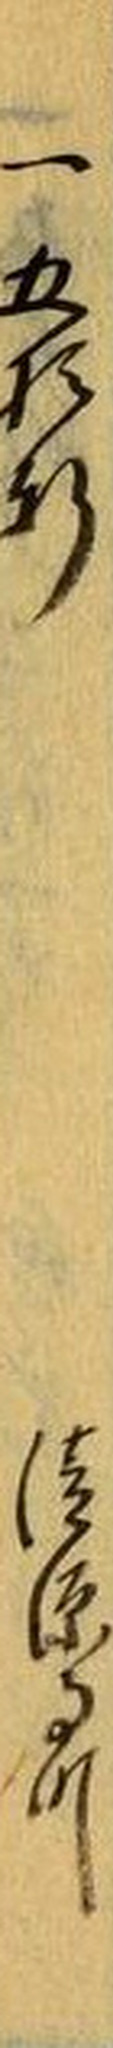一五拾軒清源寺町
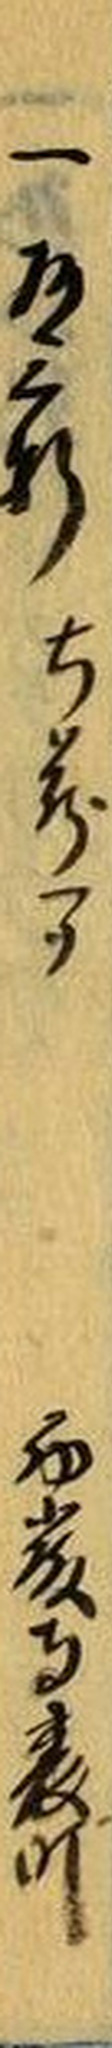一拾三軒土蔵一ッ西厳寺表町
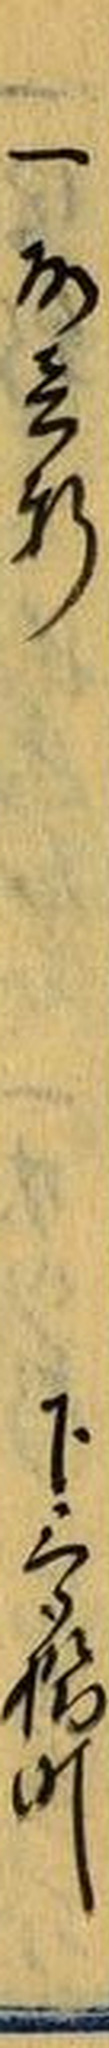一拾三軒下三ッ橋町
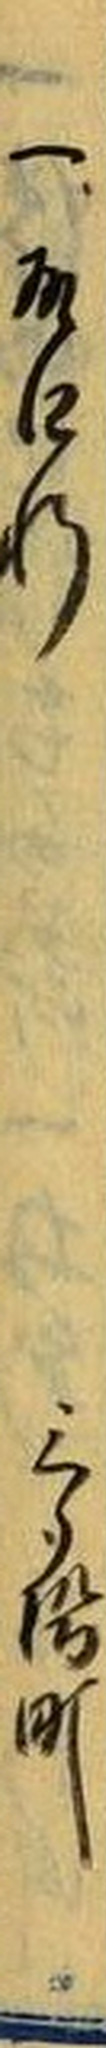一拾四軒三ッ橋町
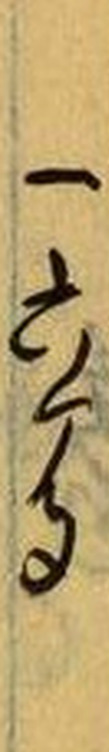一六ヶ寺
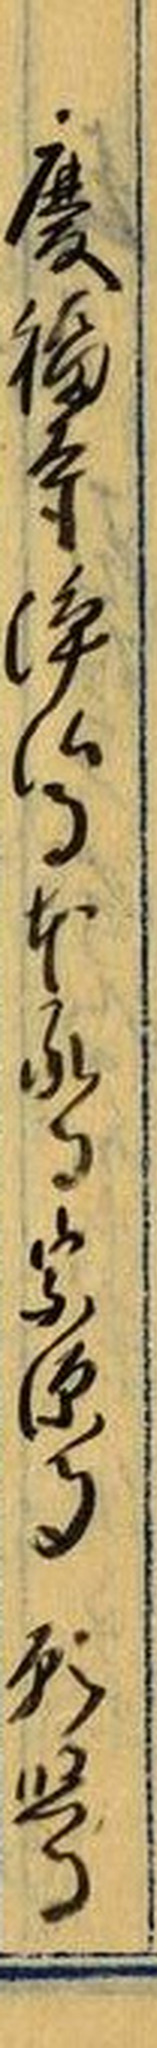慶福寺浄仏寺本承寺宗源寺願照寺
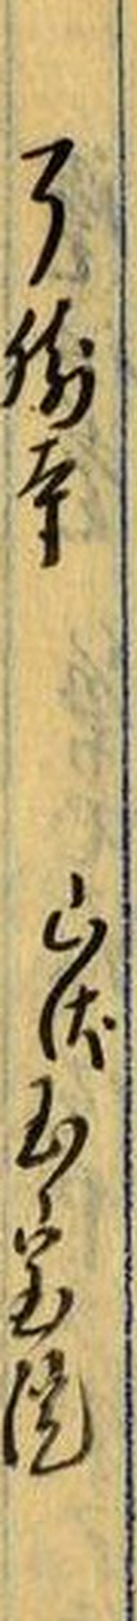了勝寺山伏玉宝院
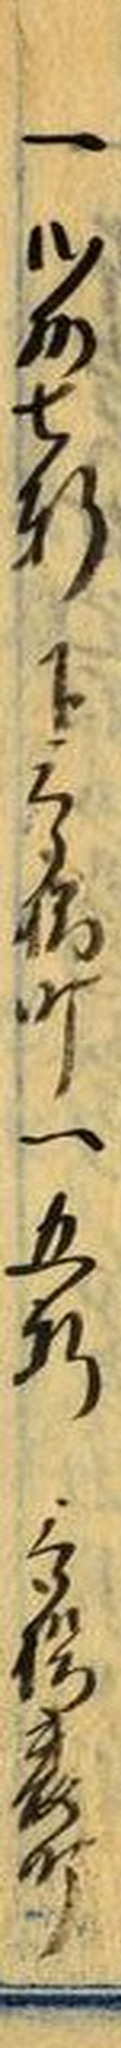一弐拾七軒下三ッ橋町一五軒三ッ橋表町
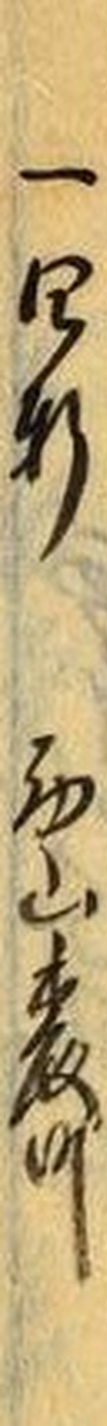一四軒西山表町
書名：温古集 五巻
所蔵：福井県文書館 Fukui Prefectural Archives
